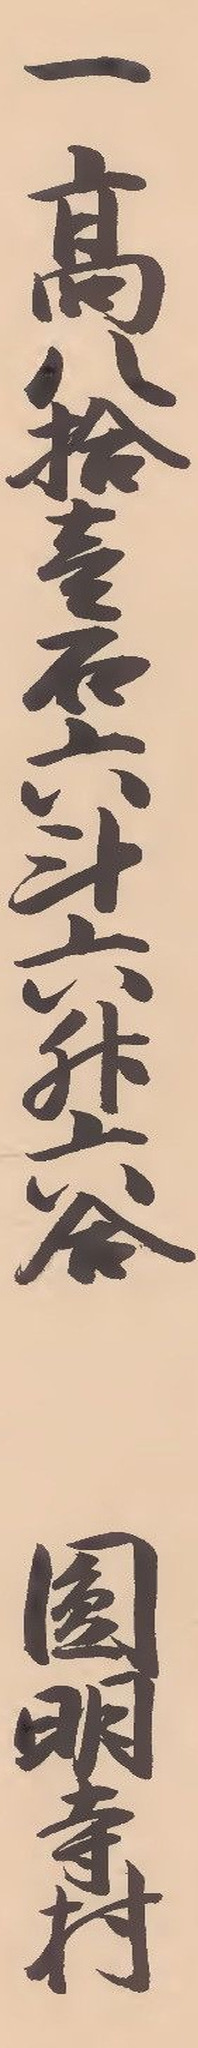一高八拾壱石六斗六升六合円明寺村
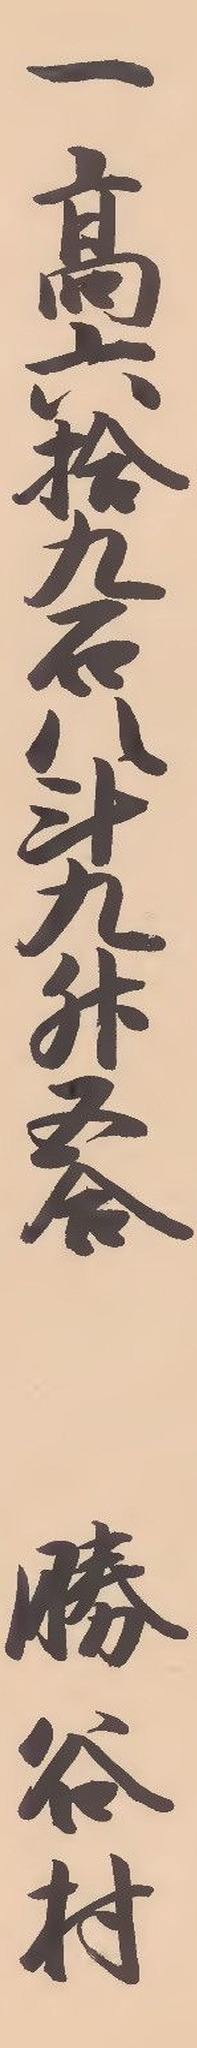一高六拾九石八斗九升五合勝谷村
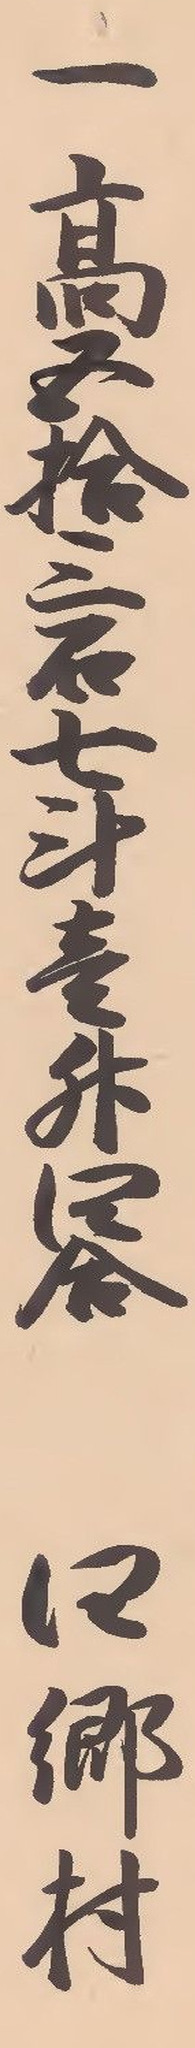一高五拾三石七斗壱升四合四郷村
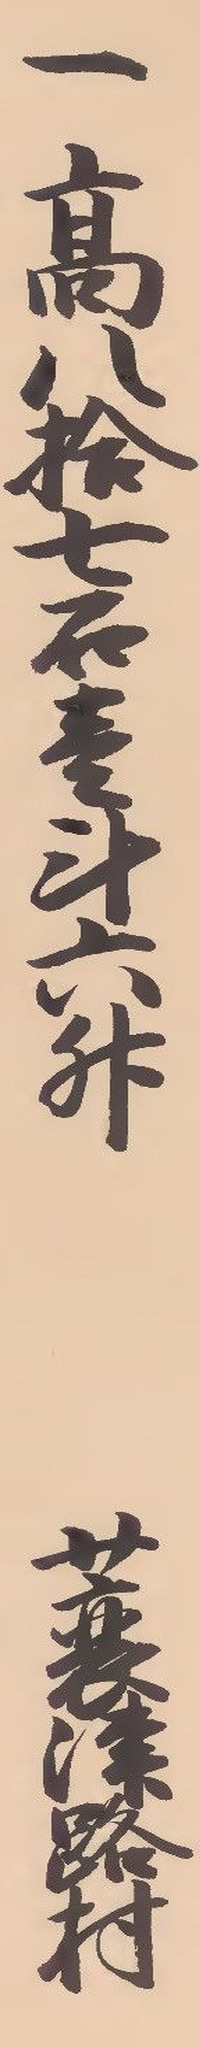一高八拾七石壱斗六升簔津路村
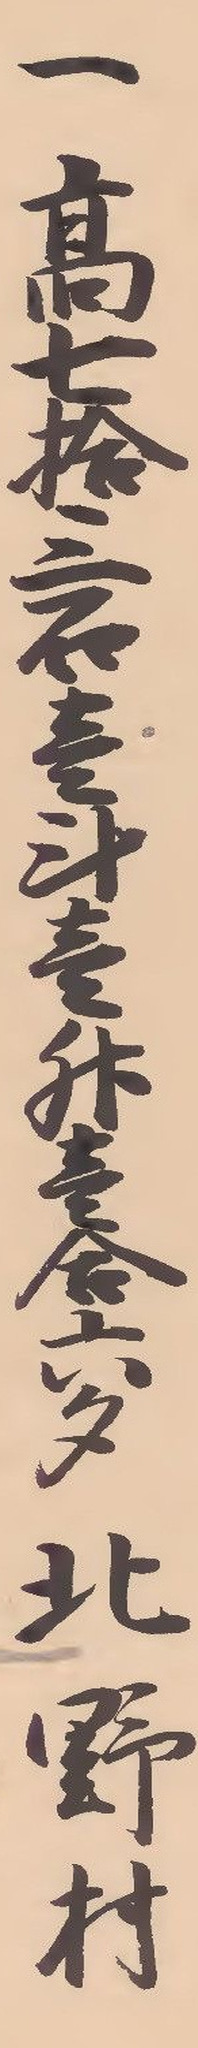一高七拾三石壱斗壱升壱合六勺北野村

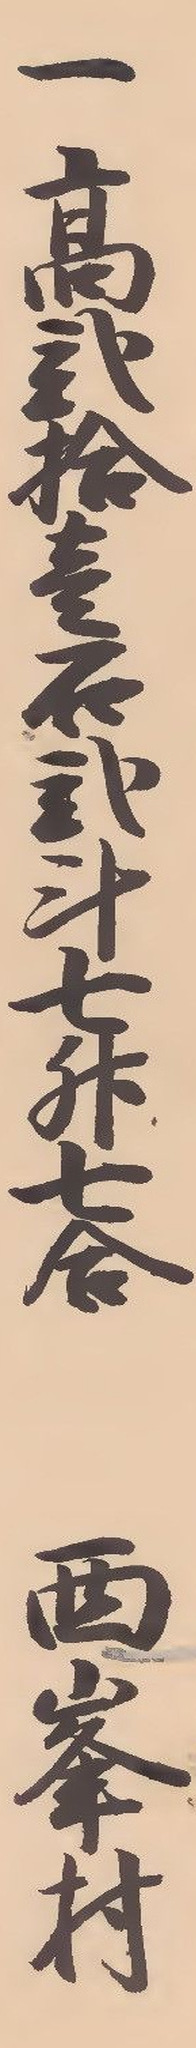一高弐拾壱石弐斗七升七合西峰村
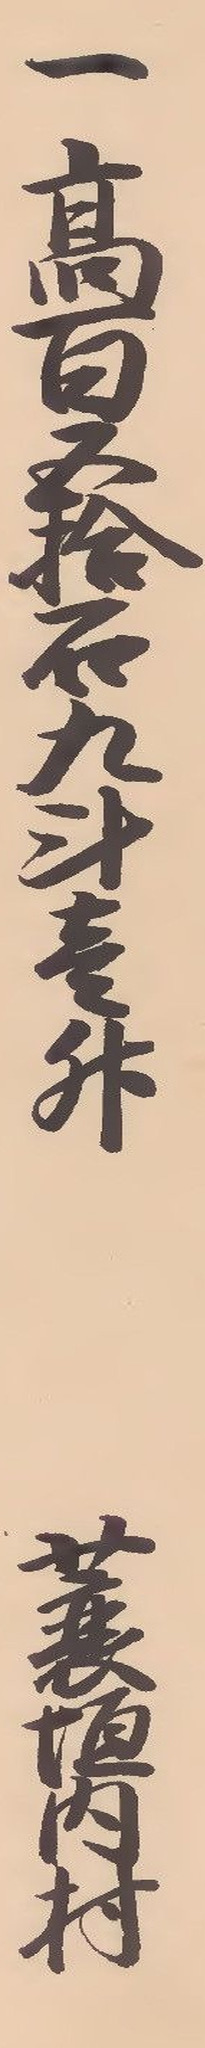一高百五拾石九斗壱升簔垣内村
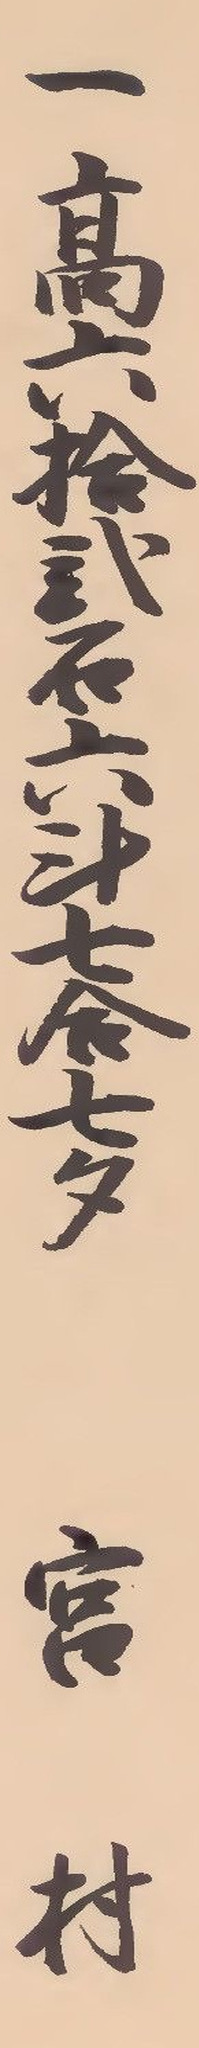一高六拾弐石六斗七合七勺宮村
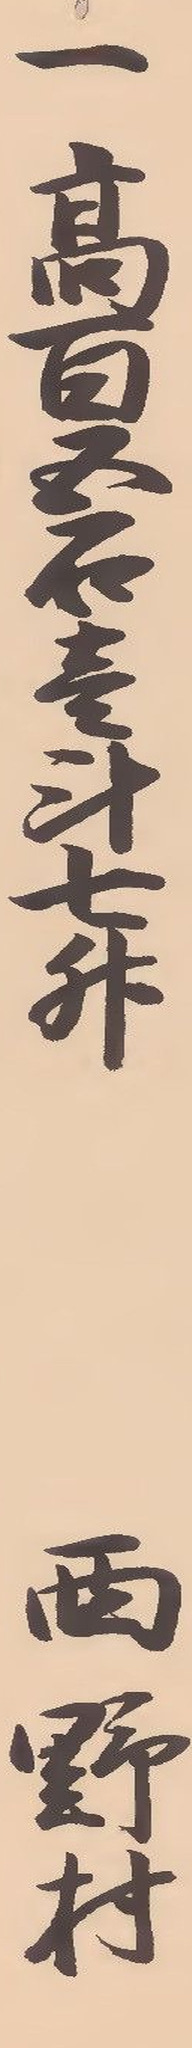一高百五石壱斗七升西野村
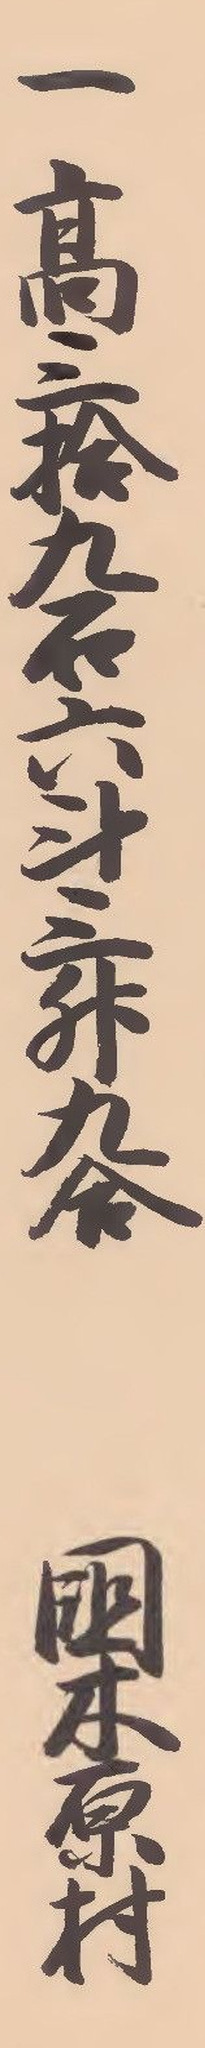一高三拾九石六斗三升九合国木原村
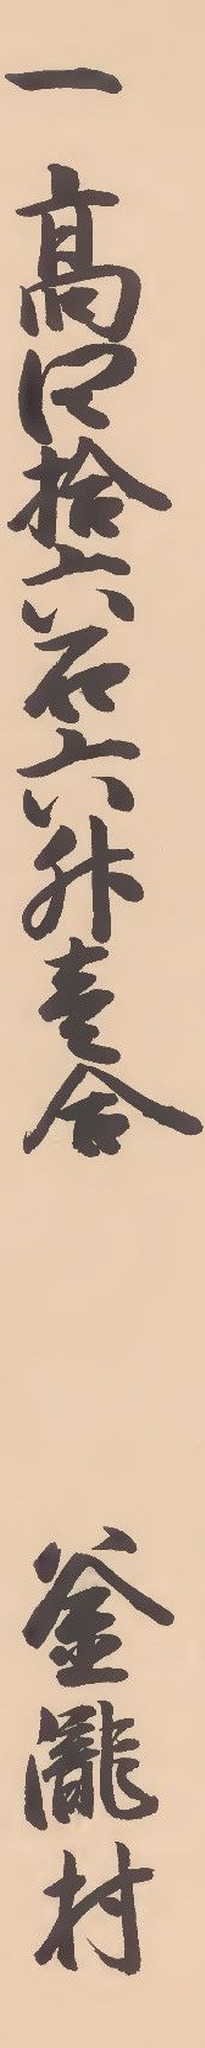一高四拾六石六升壱合釜滝村
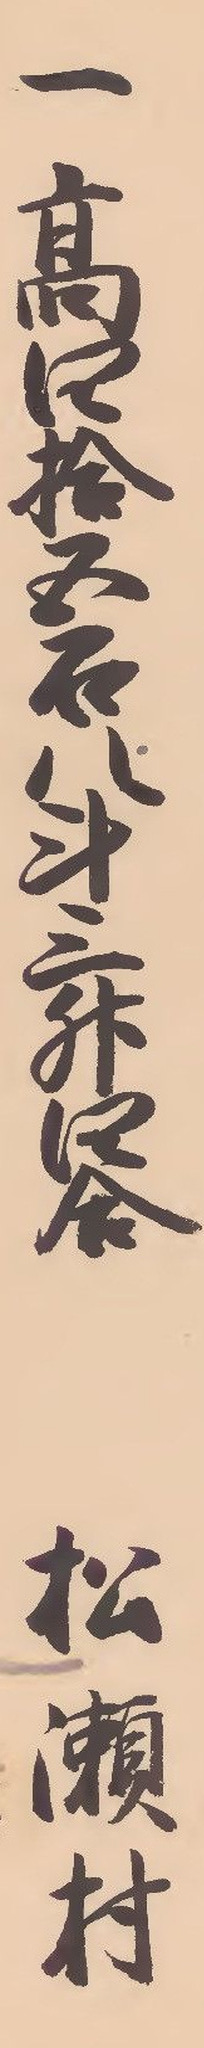一高四拾五石八斗三升四合松瀬村

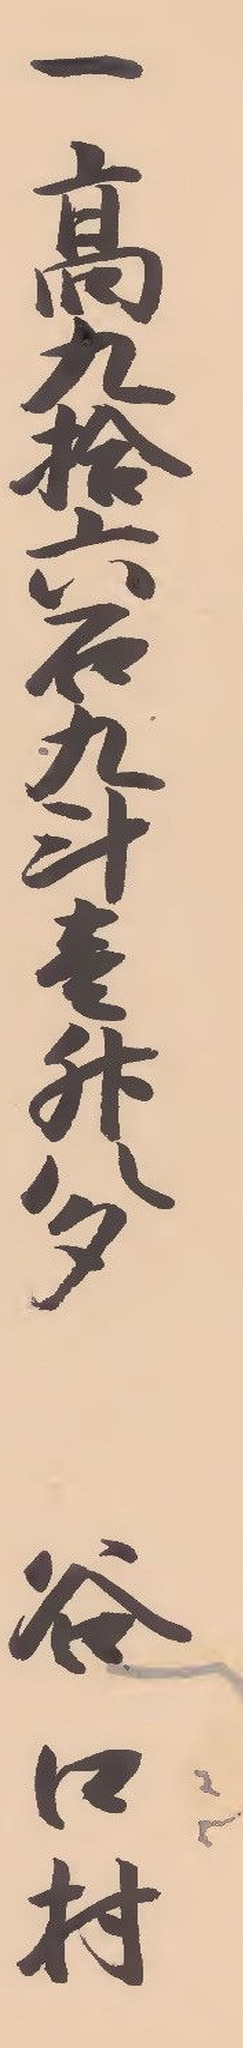一高九拾六石九斗壱升八勺谷口村
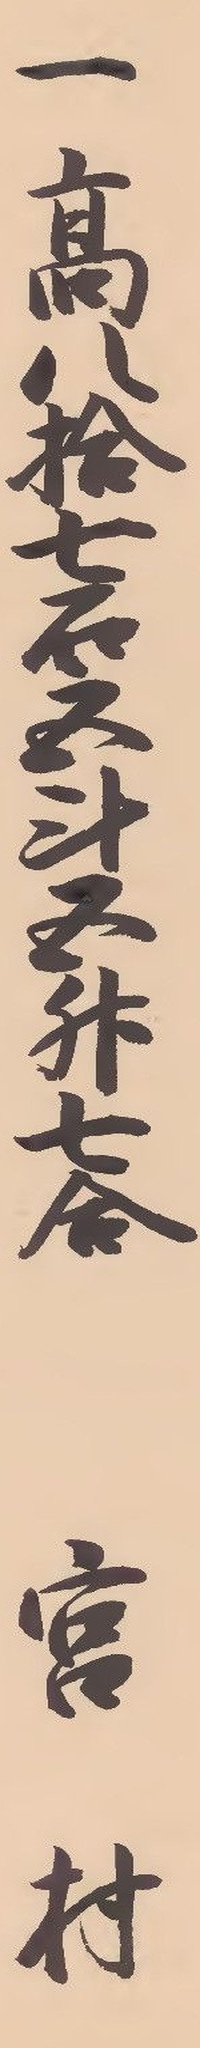一高八拾七石五斗五升七合宮村
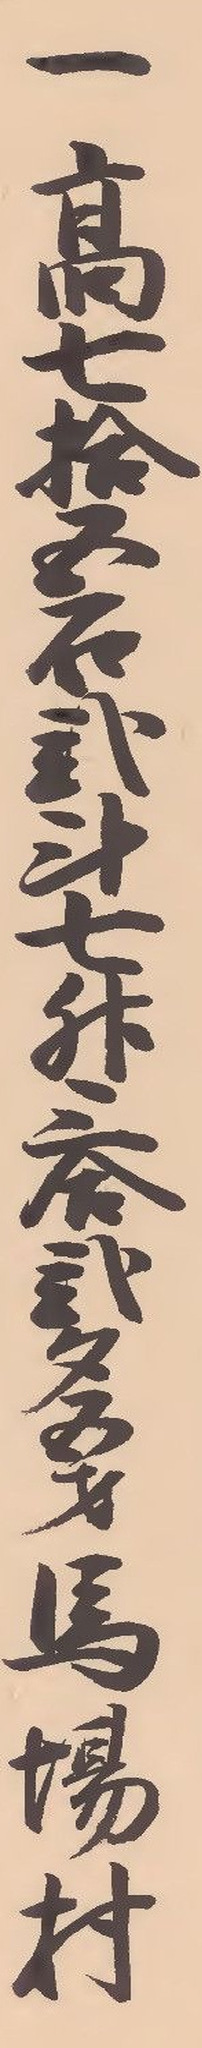一高七拾五石弐斗七升三合弐勺五才馬場村
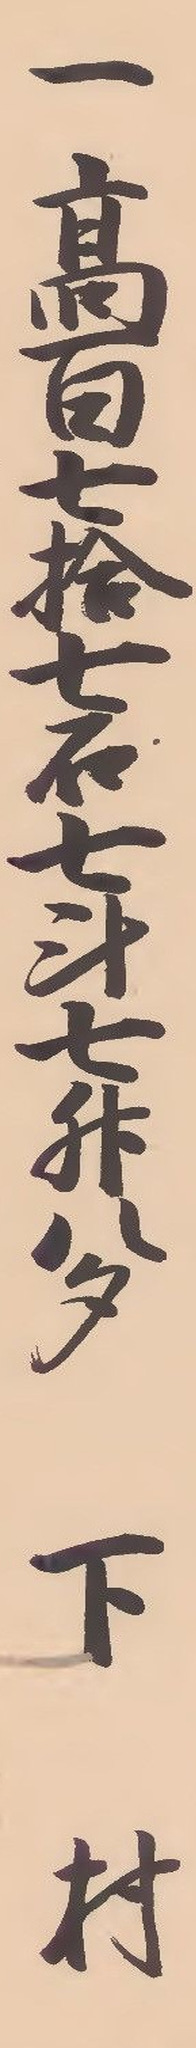一高百七拾七石七斗七升八勺下村
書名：紀伊国郷帳
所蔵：国立公文書館 National Archives of Japan
